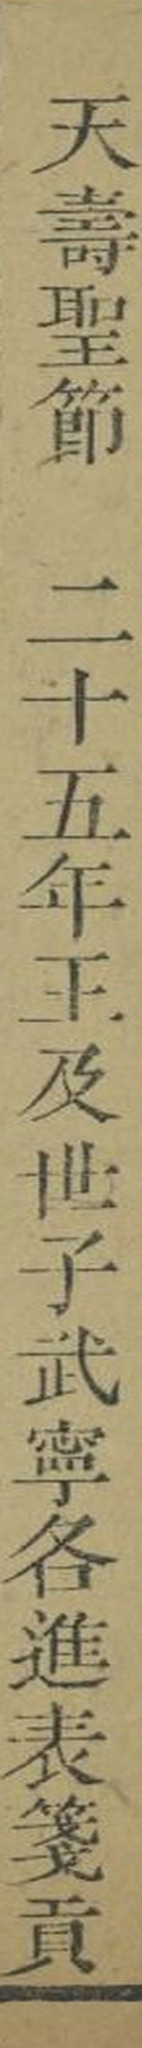天寿聖節二十五年王及世子武寧各進表箋貢
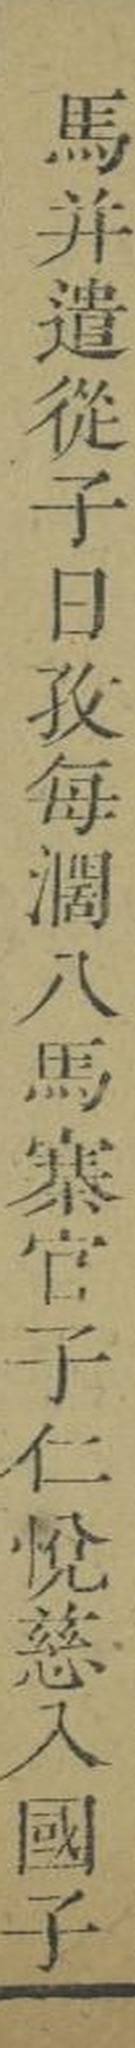馬并遣従子日孜毎濶八馬寨官子仁悦慈入国子
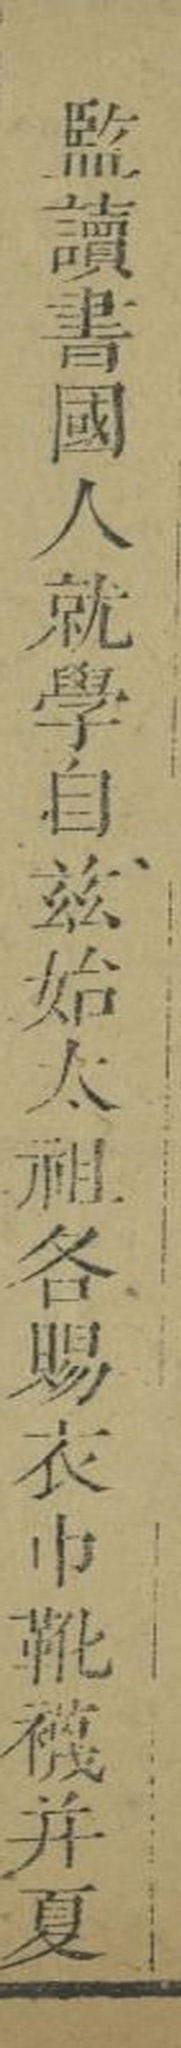監読書国人就学自茲始太祖各賜衣巾靴襪并夏
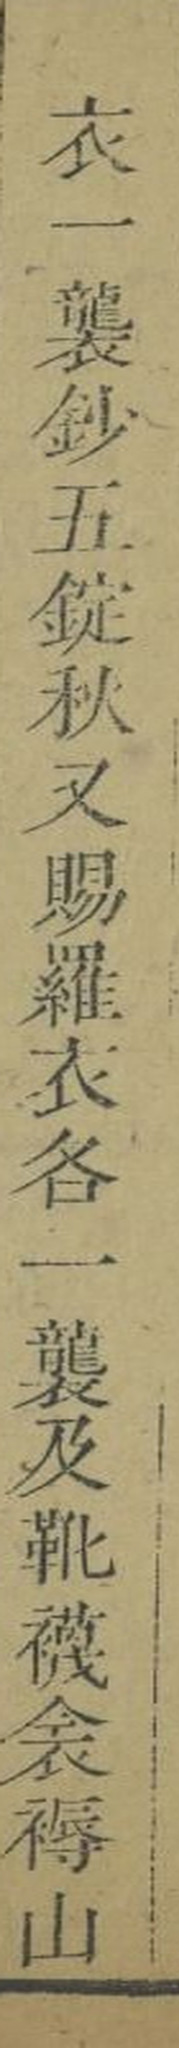衣一襲鈔五錠秋又賜羅衣各一襲及靴襪衾褥山
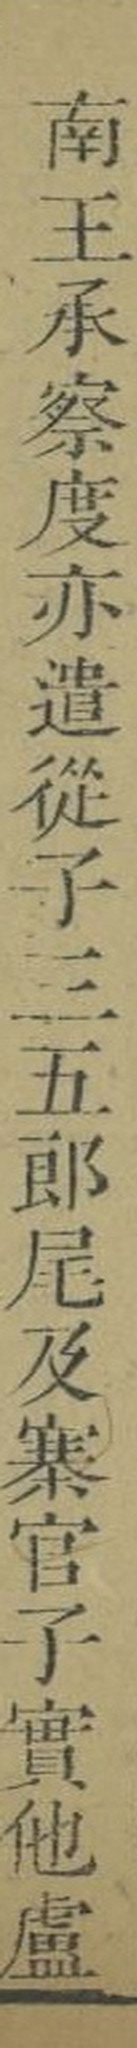南王承察度亦遣従子三五郎尾及寨官子実他盧
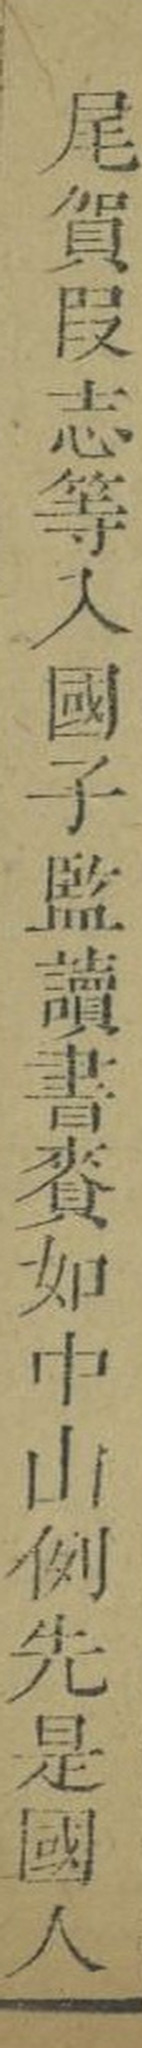尾賀叚志等入国子監読書賚如中山例先是国人
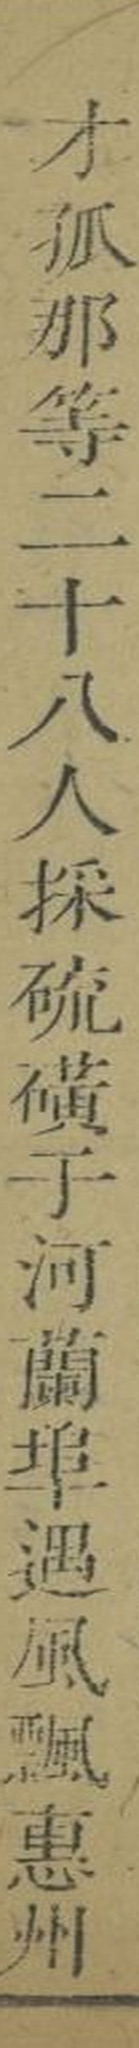才孤那等二十八人採硫磺于河蘭埠遇風飄恵州
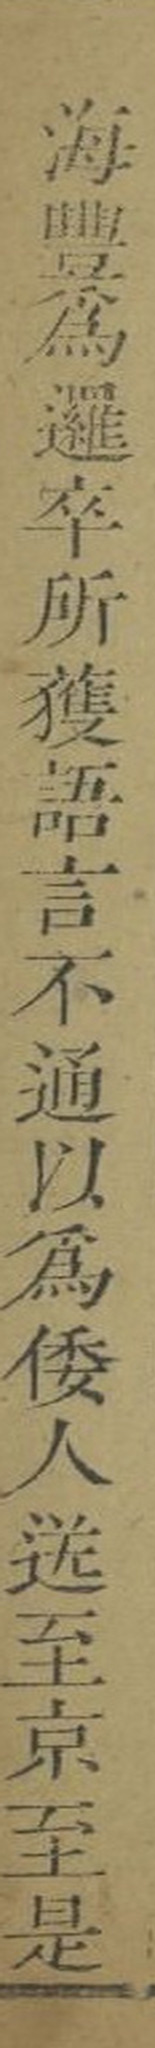海豊為邏卒所獲語言不通以為倭人送至京至是

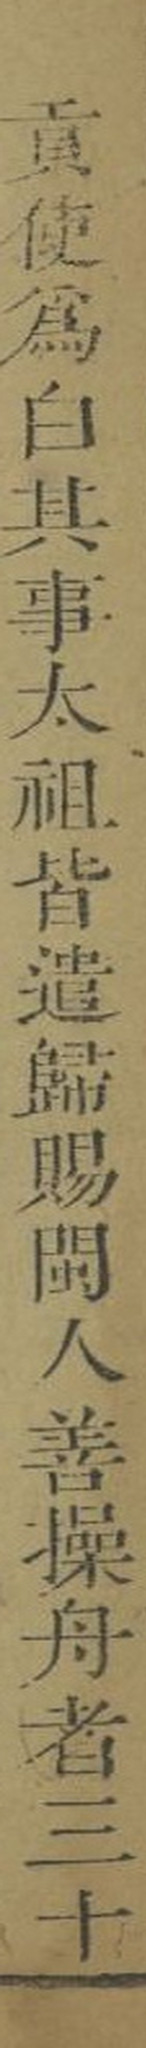貢使為白其事太祖皆遣帰賜閩人善操舟者三十
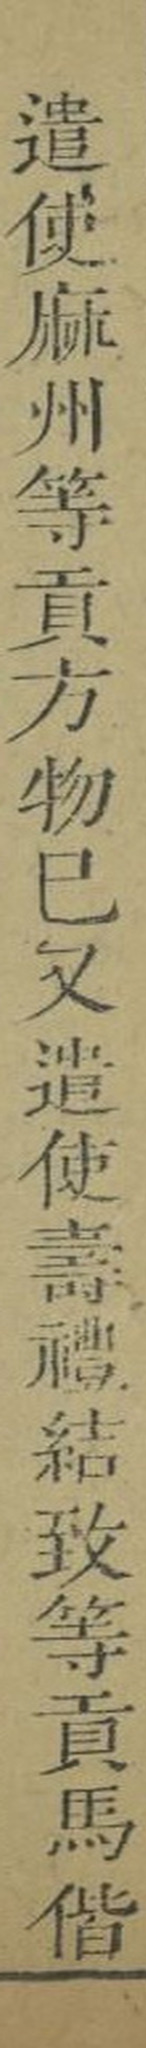遣使麻州等貢方物巳又遣使寿礼結致等貢馬偕
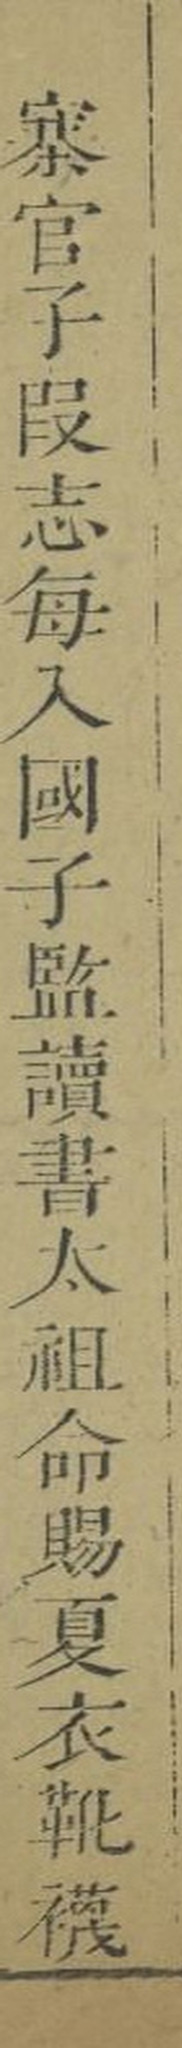寨官子叚志毎入国子監読書太祖命賜夏衣靴襪
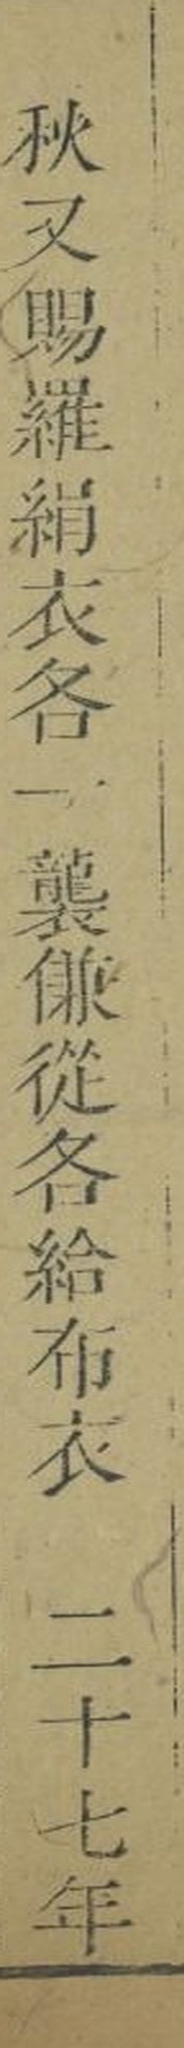秋又賜羅絹衣各一襲傔従各給布衣二十七年
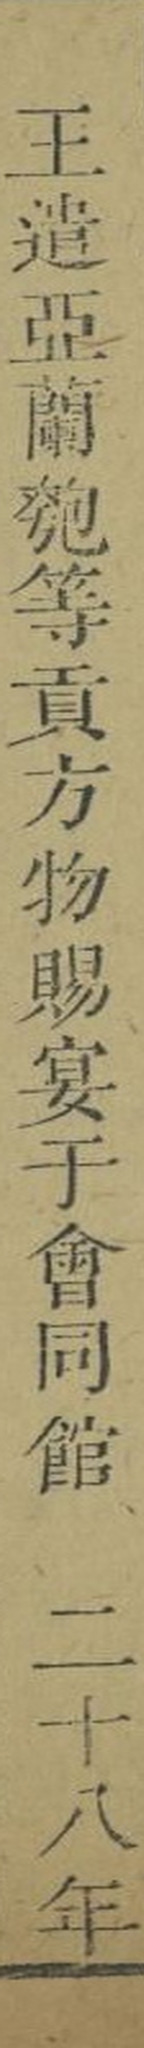王遣亜蘭匏等貢方物賜宴于会同館二十八年
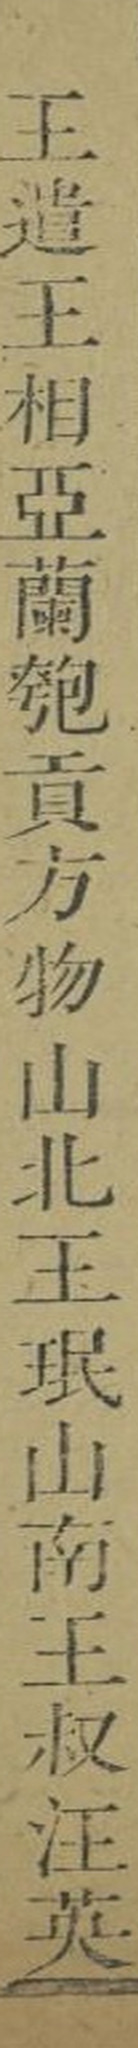王遣王相亜蘭匏貢方物山北王珉山南王叔汪英
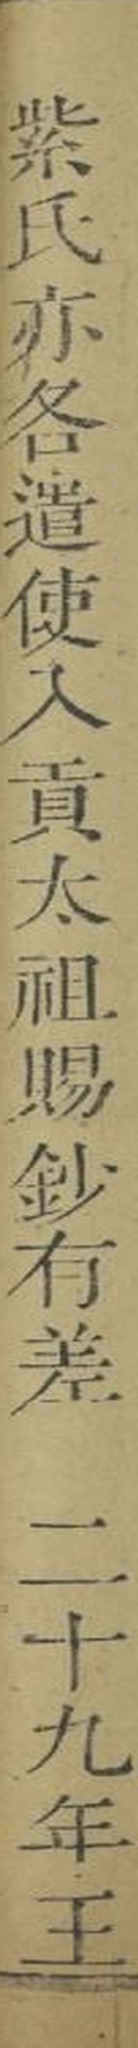紫氏亦各遣使入貢太祖賜鈔有差二十九年王
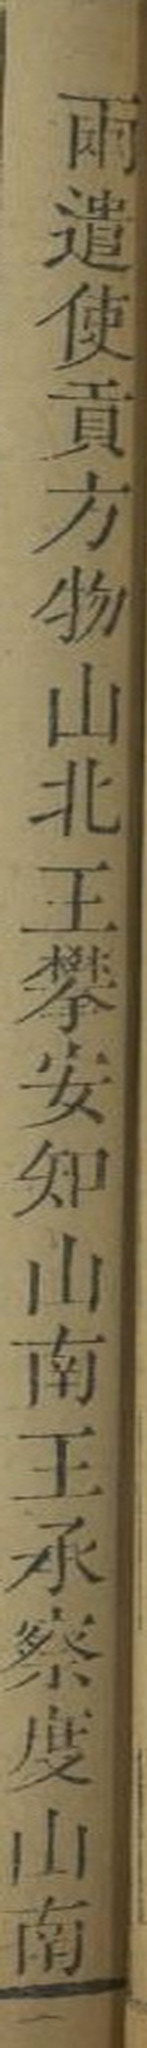両遣使貢方物山北王攀安知山南王承察度山南
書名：中山伝信録 巻三
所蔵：University of the Ryukyus Library
